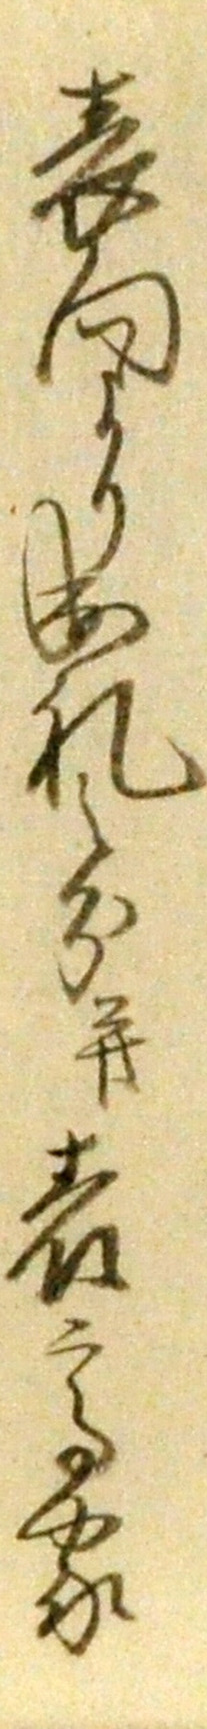表向より出礼之分并表高家
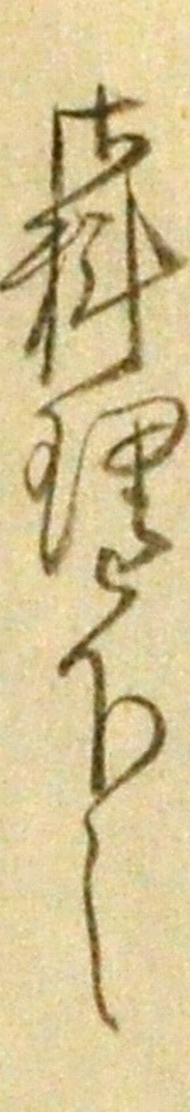御料理被下之
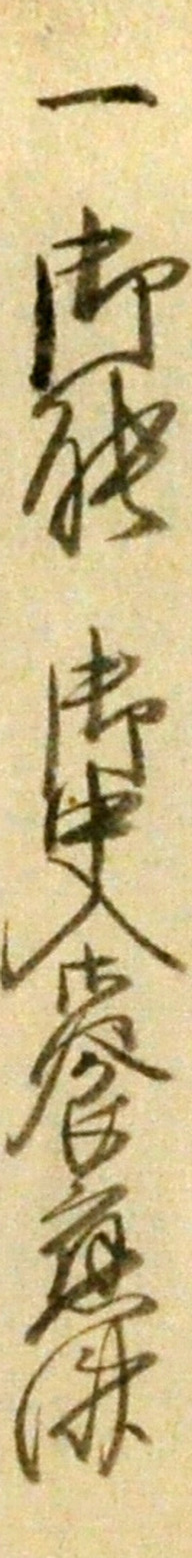一御能御中入御饗応済
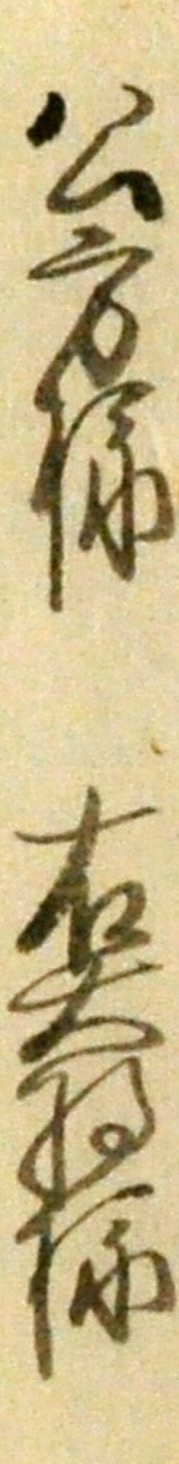公方様右大将様
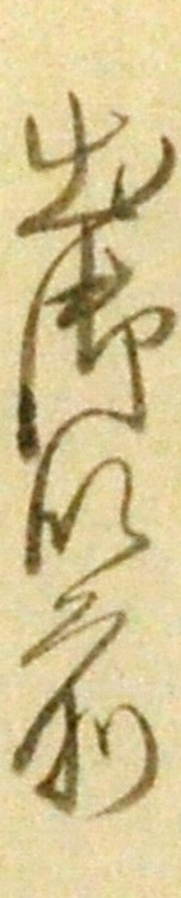出御候前

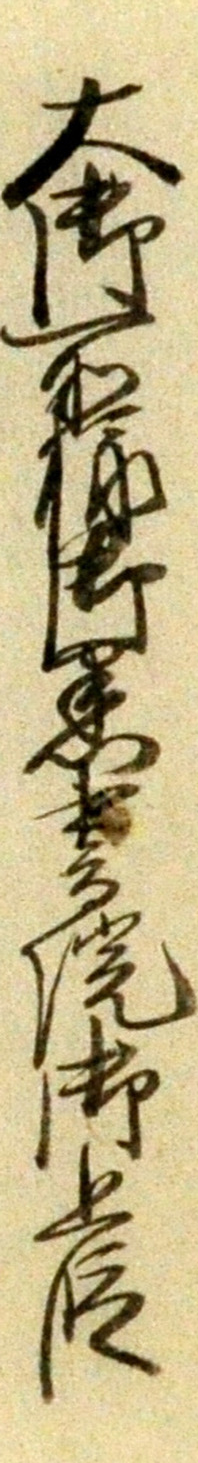大御所様御黒書院御上段
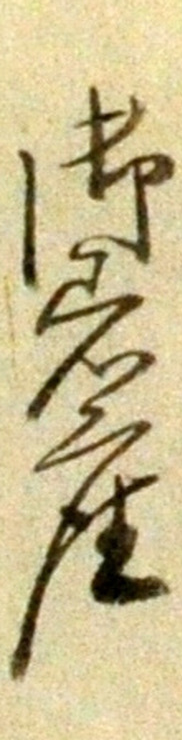御着座
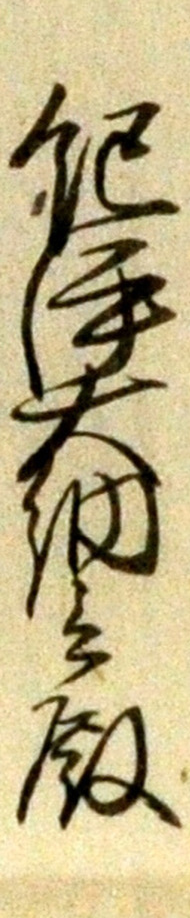紀伊大納言殿
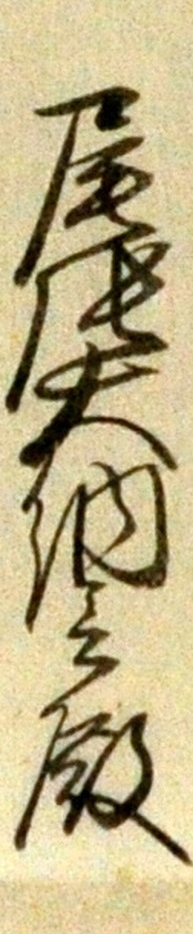尾張大納言殿
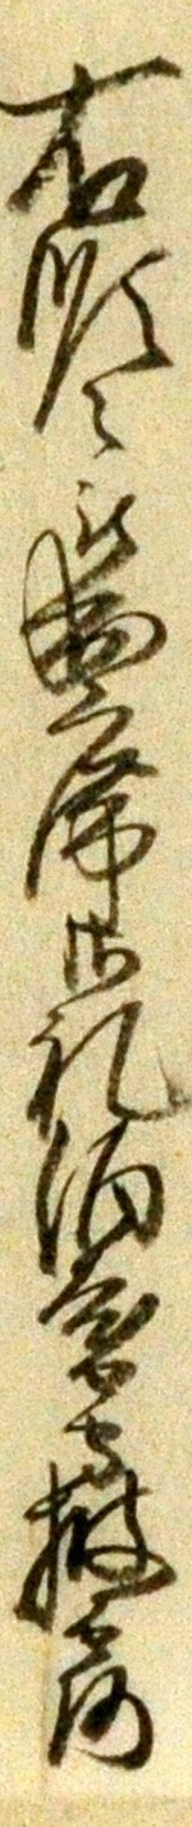右順ニ被出席御礼伯耆守披露
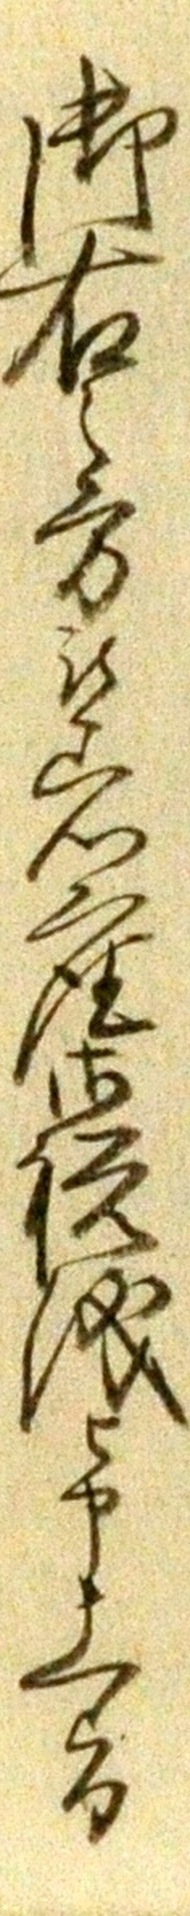御右之方被着座御祝儀被申上旨
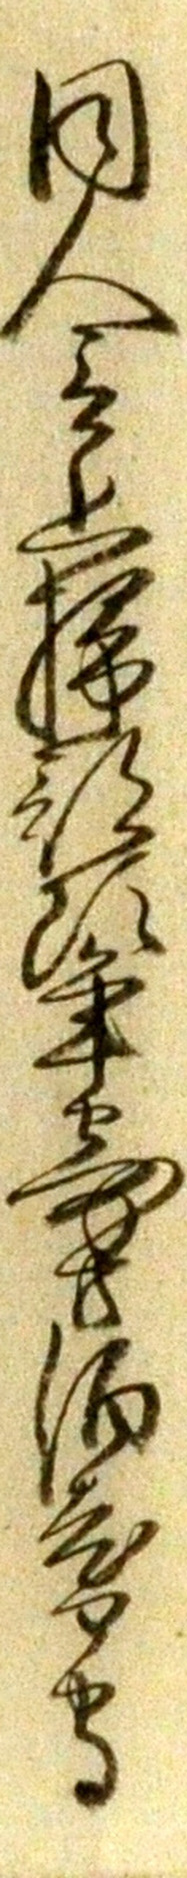同人言上掃部頭年寄共伯耆守
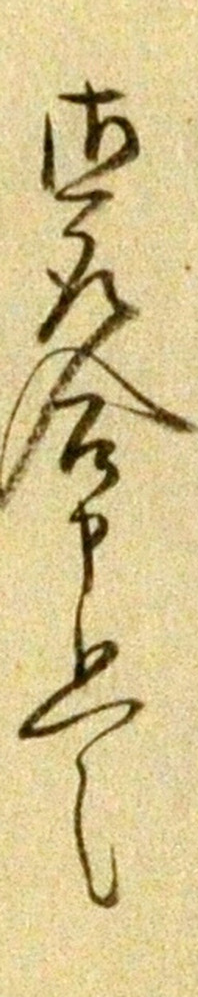御取合申上之
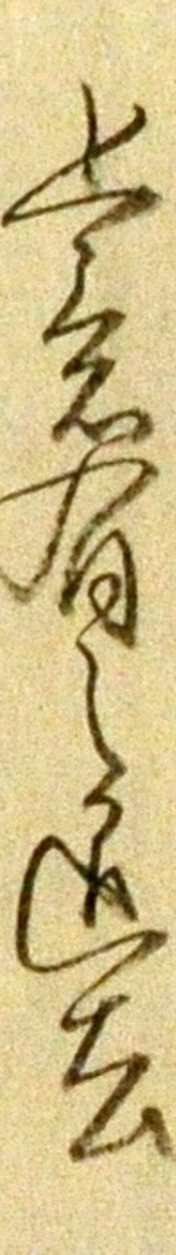上意有之退去
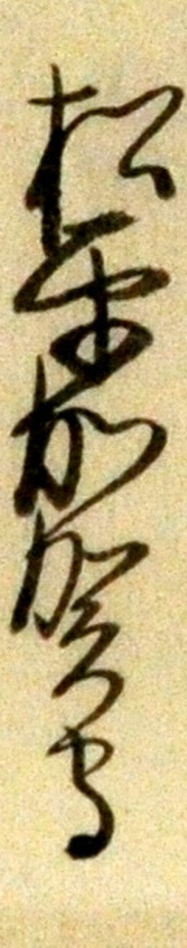松平加賀守
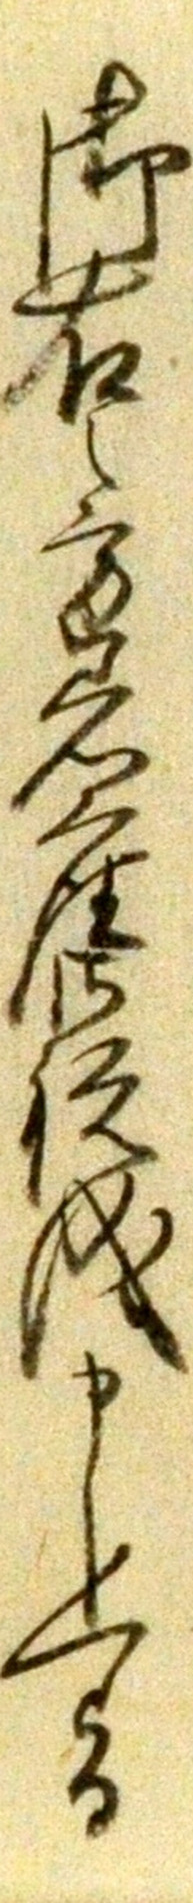御右之方着座御祝儀申上旨
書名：御馳走御能ノ節ノ留外
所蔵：伊那市立高遠町図書館・合同会社AMANE
